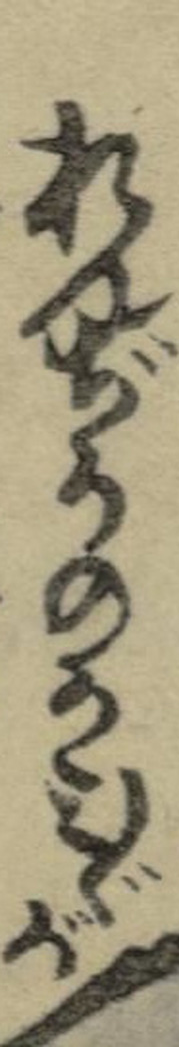れんぢうのかみ〴〵が
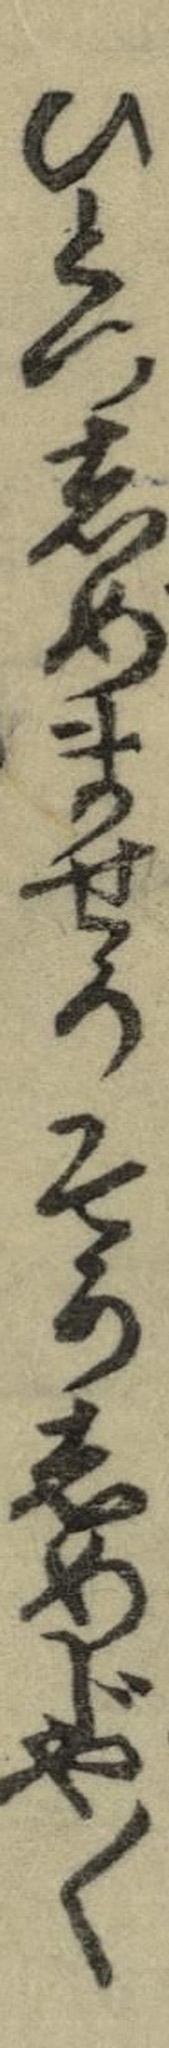ひとつしめませうそうしめじや〳〵
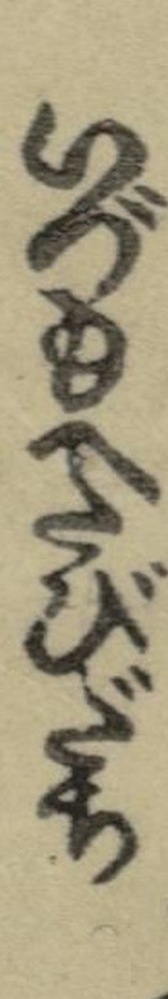いづもへたびだち
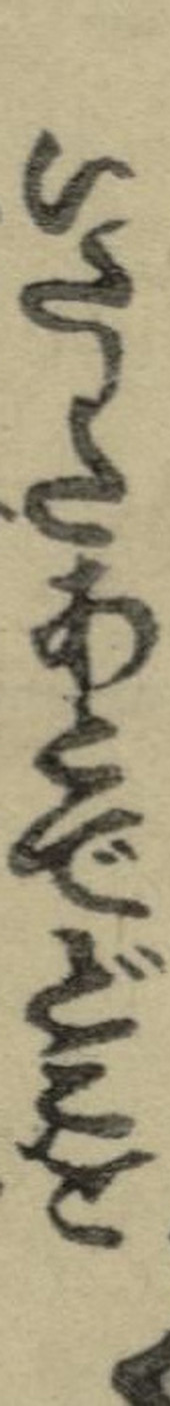いたしたあとでどこを
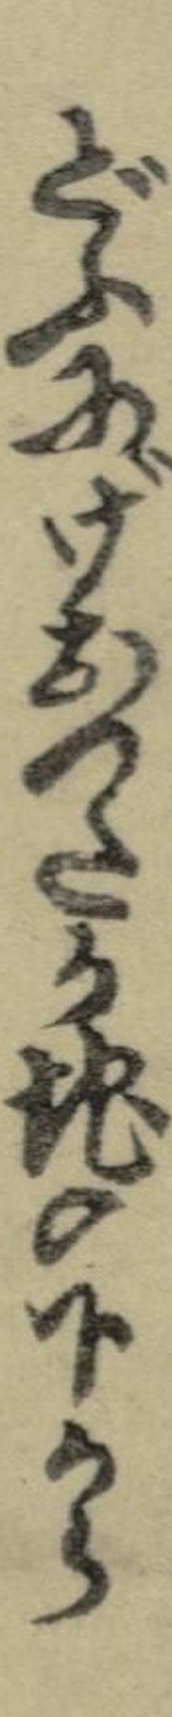どふにげおつたか地の下から
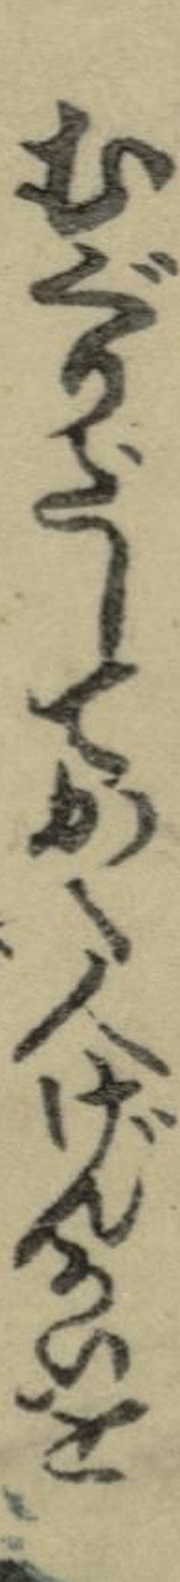むぐりだしてかく人げんかいを
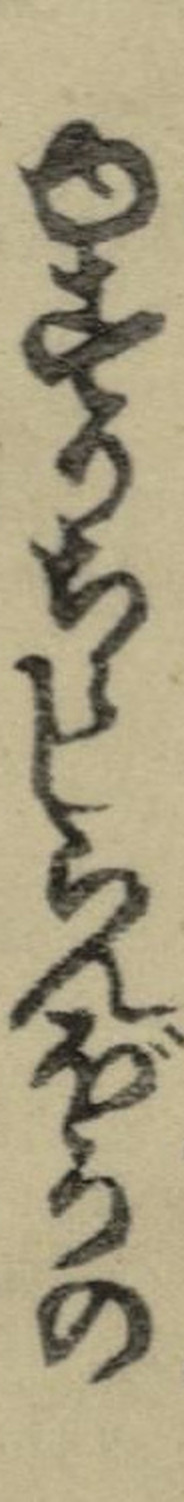ゆすりちらしらんぼうの
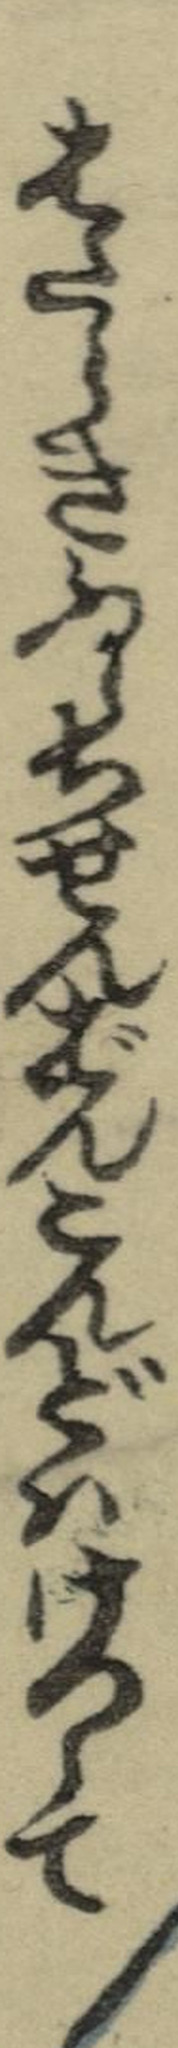はたらきふらちせんばんこんどはけつして
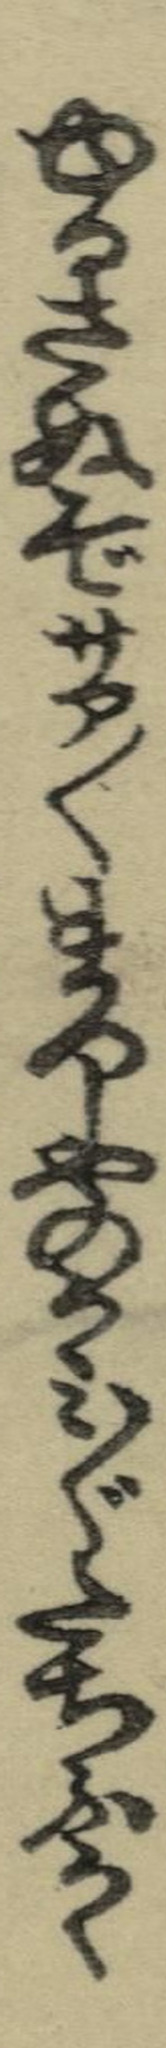ゆるさぬぞサア〳〵まつしやのかみ〴〵たちふかく
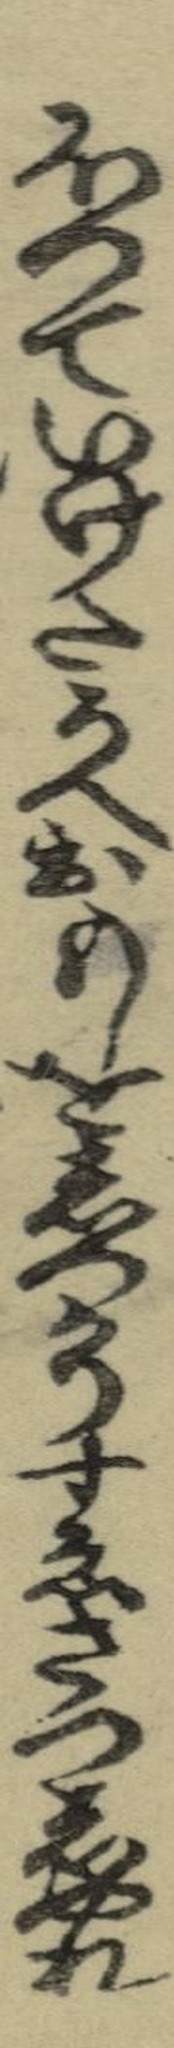ほつていけたうへおもしをしつかりすゑさつしやれ
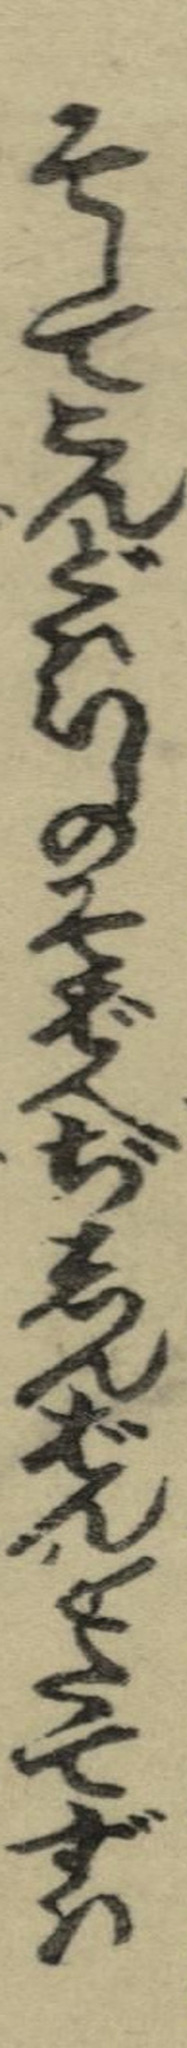そしてこんどはいしのそばへぢしんばんをたてずは
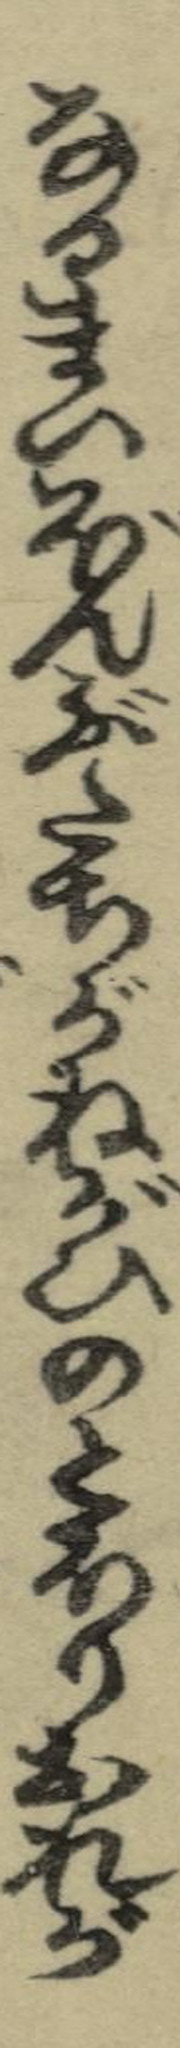なるまいぼんぶたちがねがひのとほりおれが
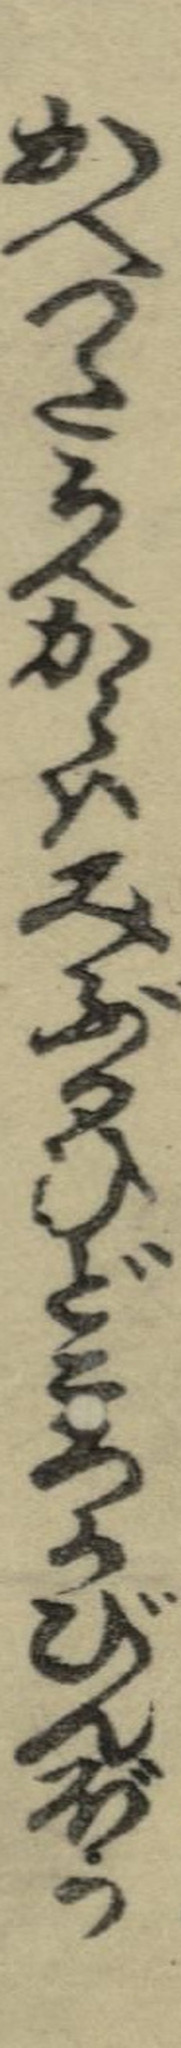かへつたうへからはみぶるいひどころかびんぼう
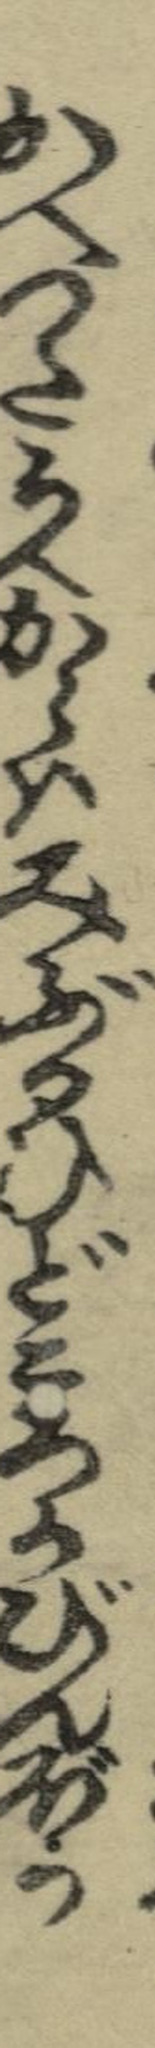かへつたうへからはみぶるいひどころかびんぼう
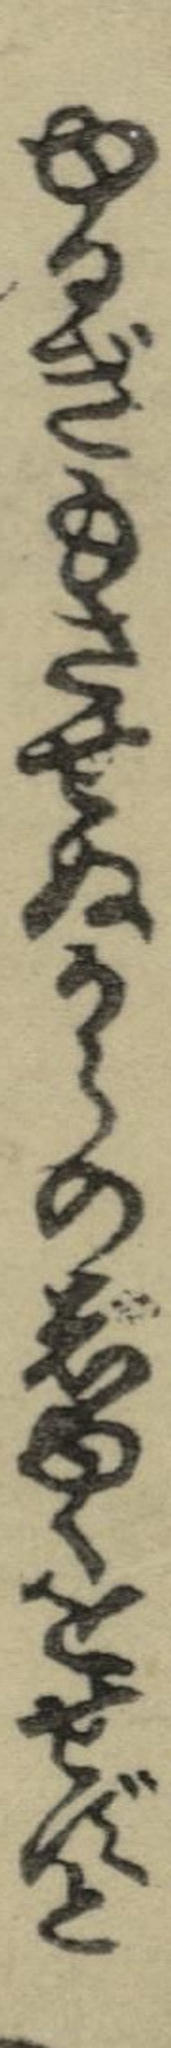ゆるぎもさせぬからのじゆくをせずと
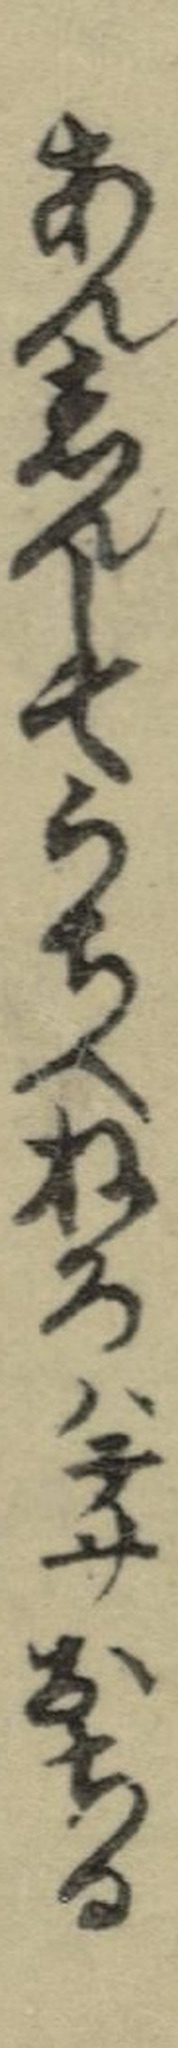あんしんしてうちへねろハテサおちる
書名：おそろ感心要石
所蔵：東京大学地震研究所図書室 Earthquake Research Institute Library, The University of Tokyo, JAPAN
